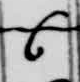6
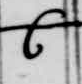6
